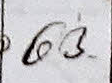63
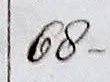68
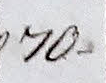70
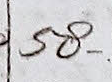58
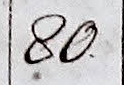80.
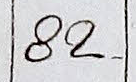82
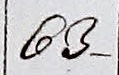63
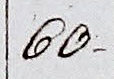60
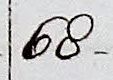68
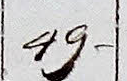49
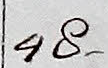48
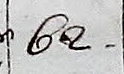62
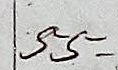55
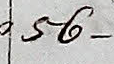56
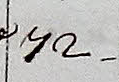72
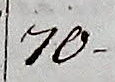70
